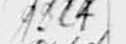9324
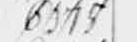6375
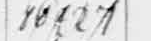16427
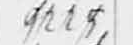9225
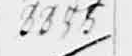3355
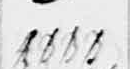1333
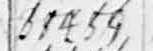31454
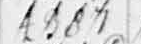4387
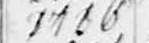1736
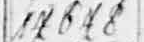14848
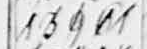13961
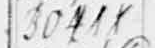30411
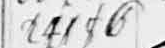24156
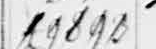19893
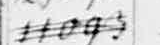11093
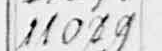11039
